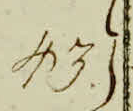43.
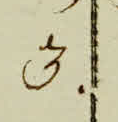3.
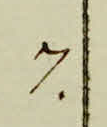7.
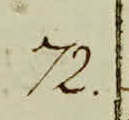72.
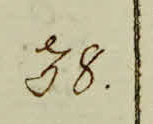38.
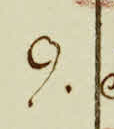9.
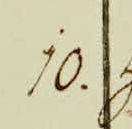10.
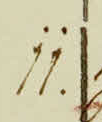11.
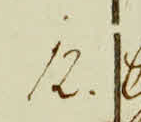12.
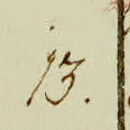13.
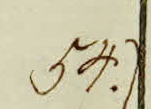54.
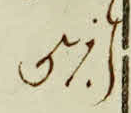51.
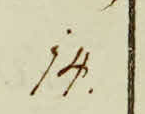14.
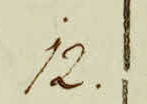12.
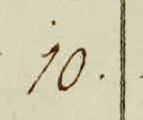10.
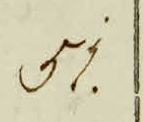51.
